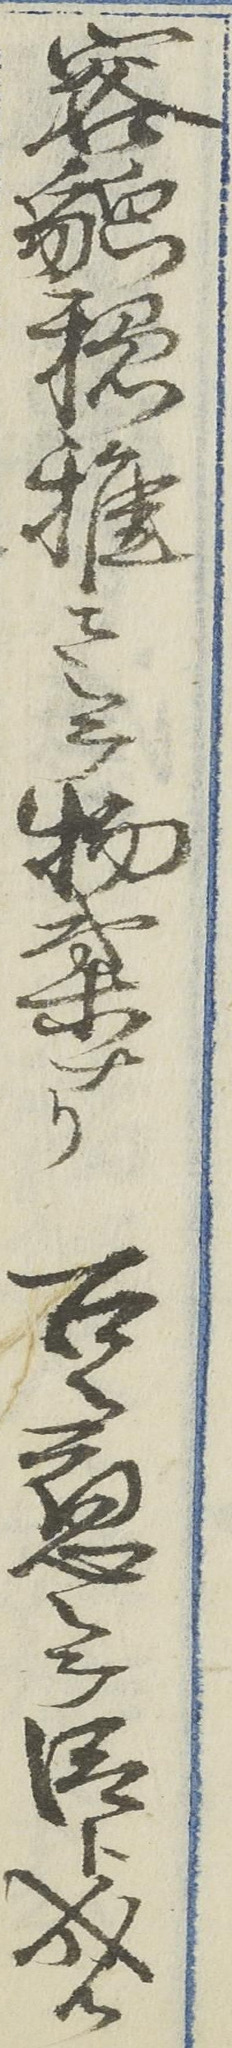容貌穏雅ニシテ物柔ナリ召ニ応シテ臣ト成ル

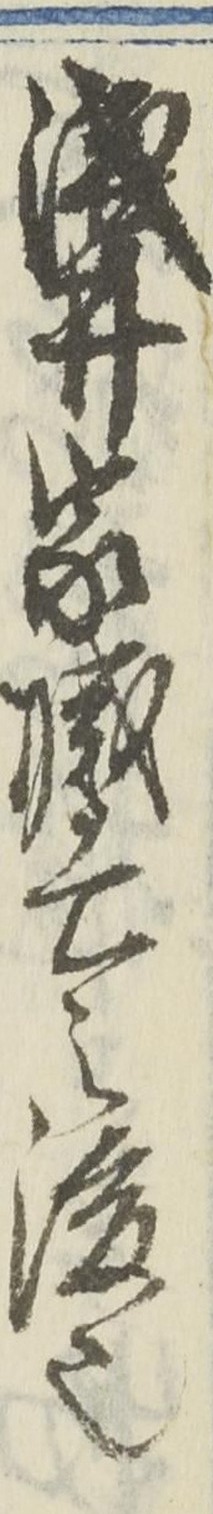浅井家滅亡之後也
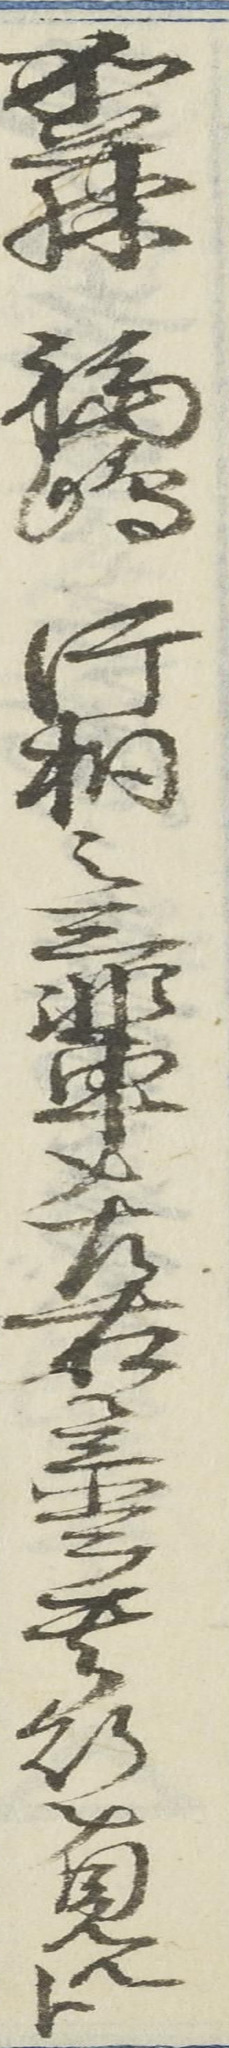加藤福嶋片桐之三輩ヲ左右へ置テ其行ヲ見ルト
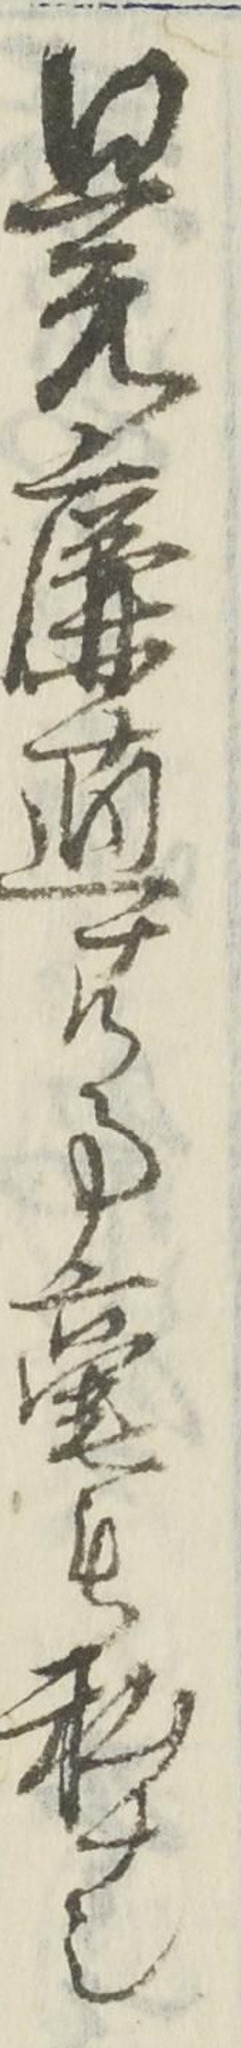且元廉直ナル事毫も私ナシ
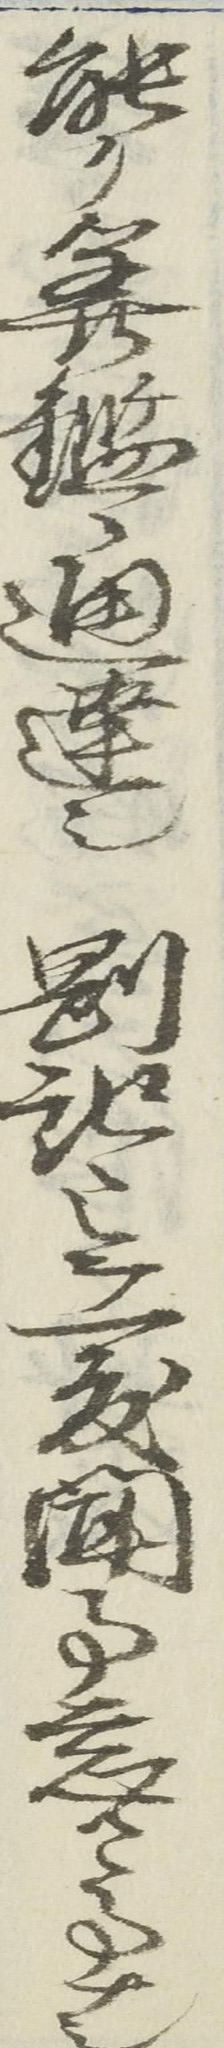能ク算鑑ニ通達シ剛記ニシテ一度聞事忘ルヾ事ナシ
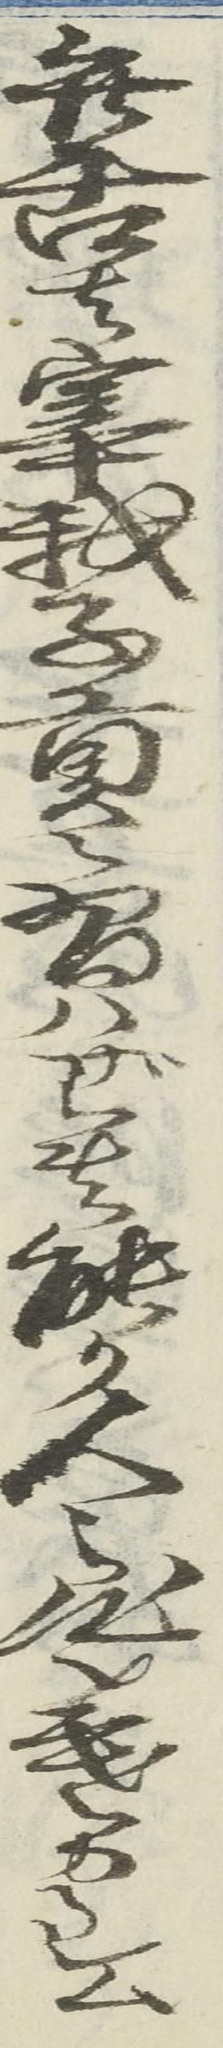弁舌は宰我子貢ニ習ハザレ共能ク人之心ヲ遣カろシム
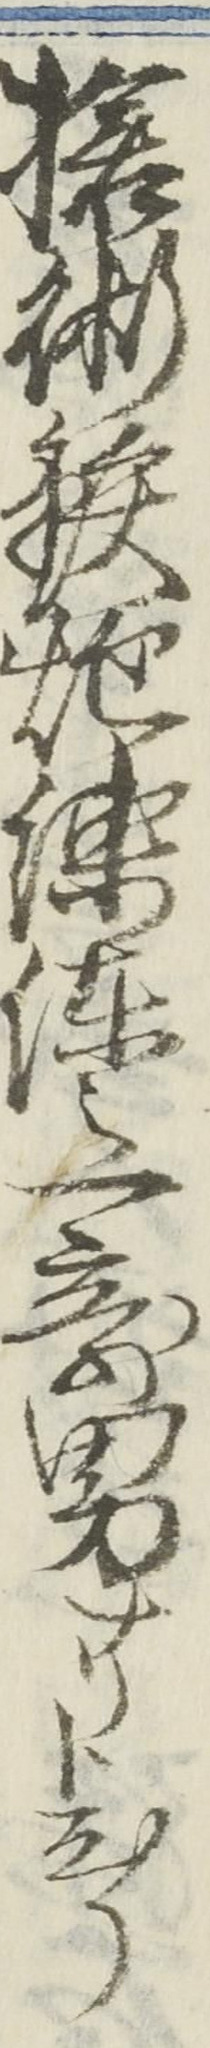槍術鉄砲練倲之一奇男ナリト云う
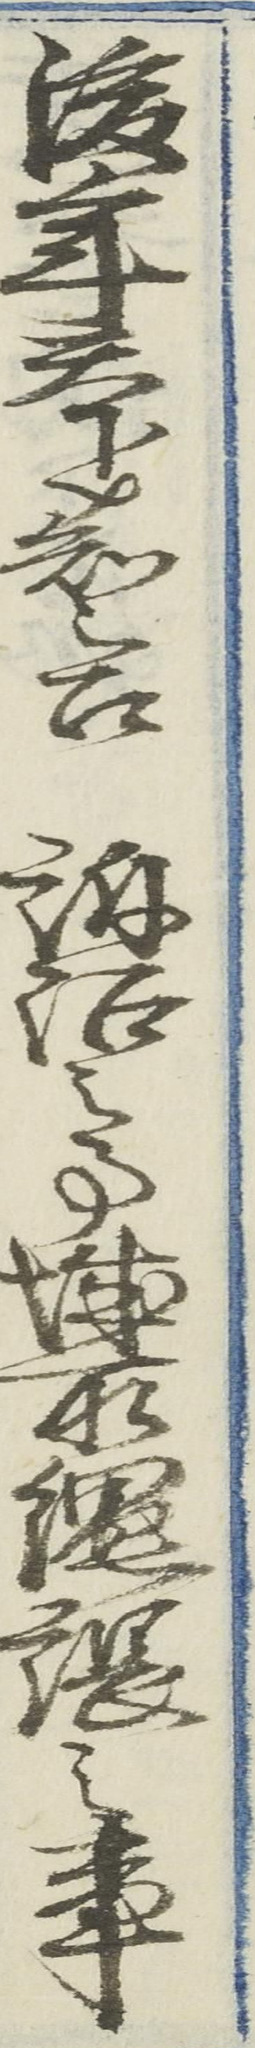後年天下を知ニ右訴詔之事城取縄張之事
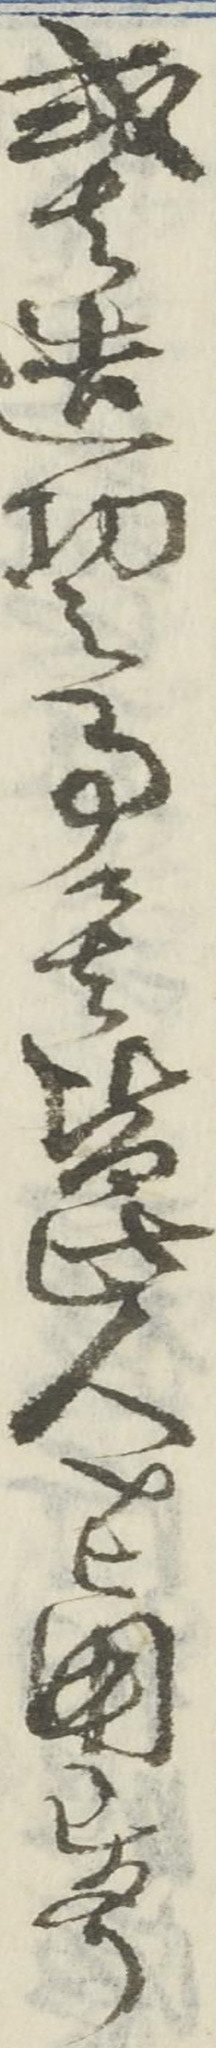或は造功之事ニは皆此人ヲ被用候タリ
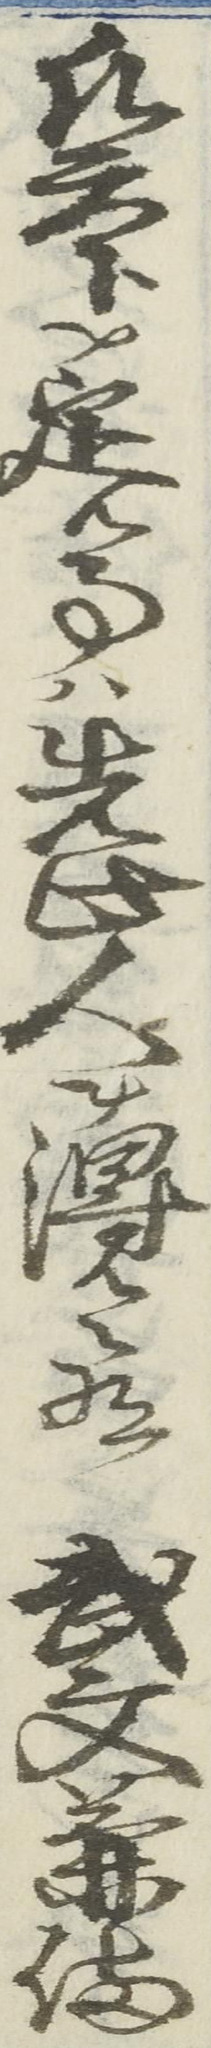凡天下ヲ定ル事ハ先此人ヲ得ルニ有武文兼備
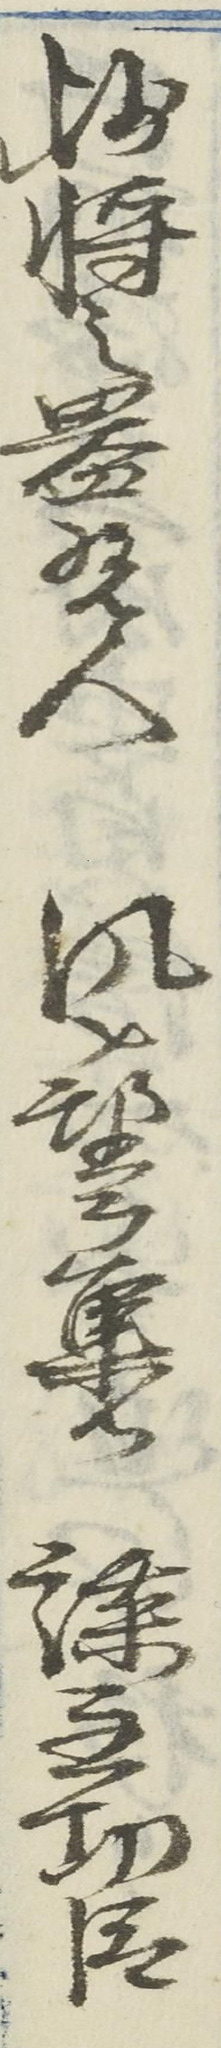帥将之器有ル人風ヲ望テ集ル謀主功臣
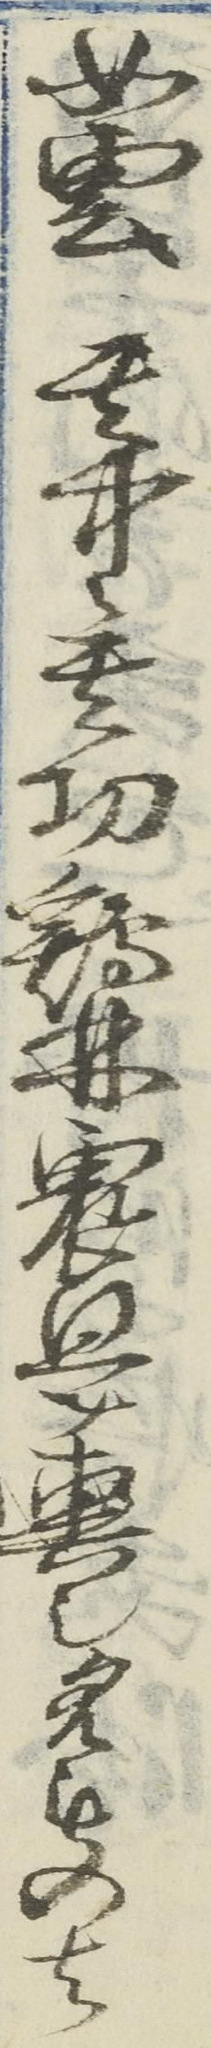如雲其中ニ其功鶏林震奥ヲ興シタものは
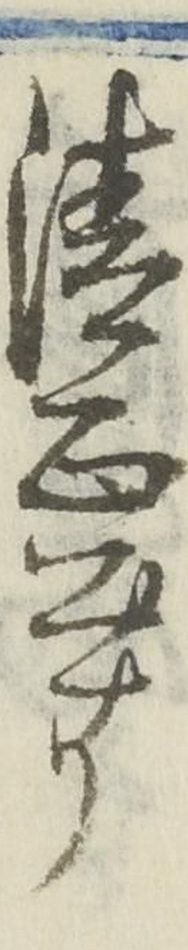清正公ナリ
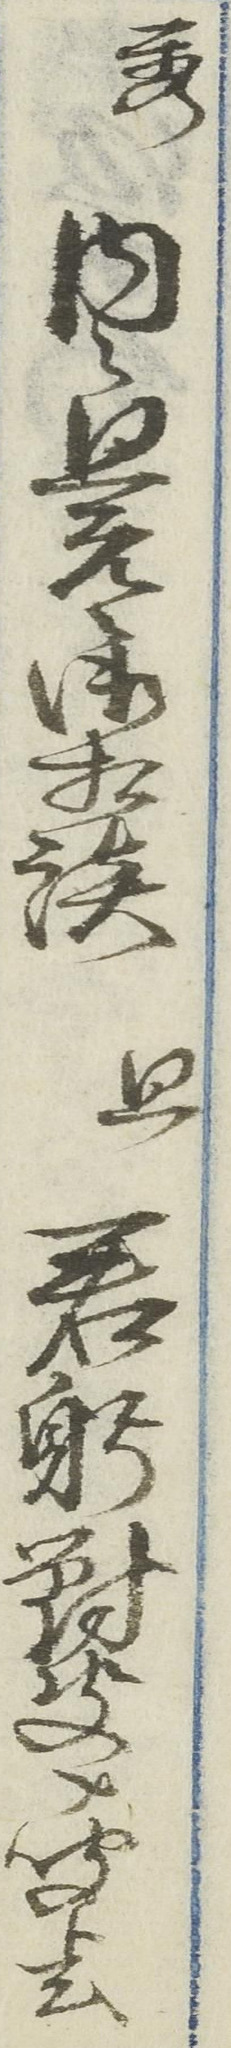秀内々且元ニ御相談且君躬対決ヲ聞ト云
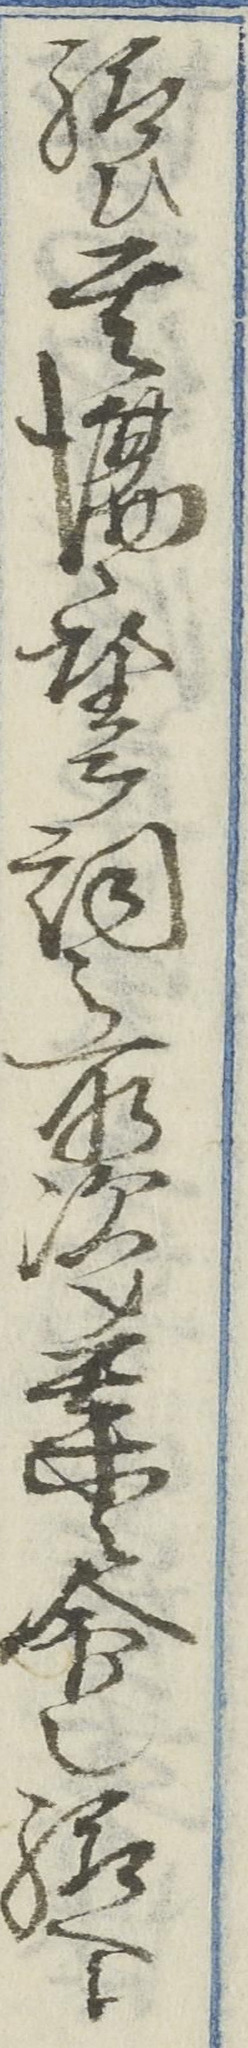給ヒ其場ニ望テ詞之取次ヲ某ニ命し給ヘト
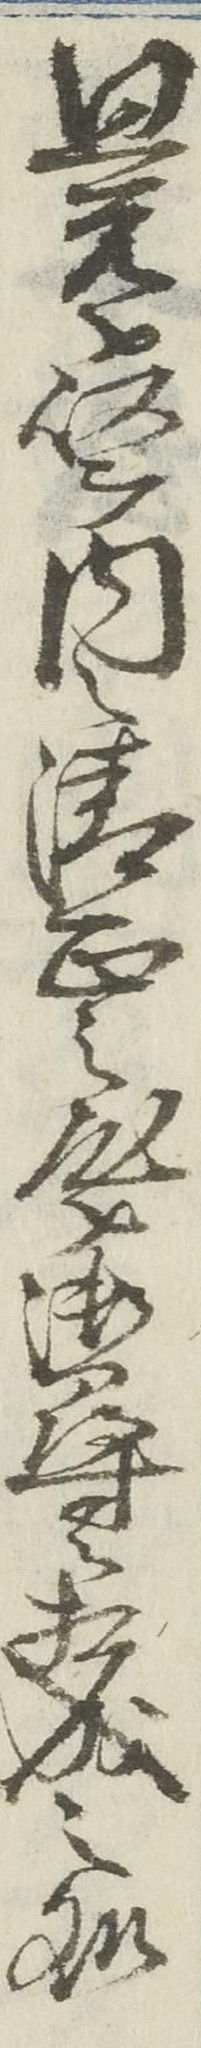且元ヲ以テ内々清正之之心ヲ御尋ニ相成之処
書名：伏水大地震
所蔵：東京大学地震研究所図書室 Earthquake Research Institute Library, The University of Tokyo, JAPAN
